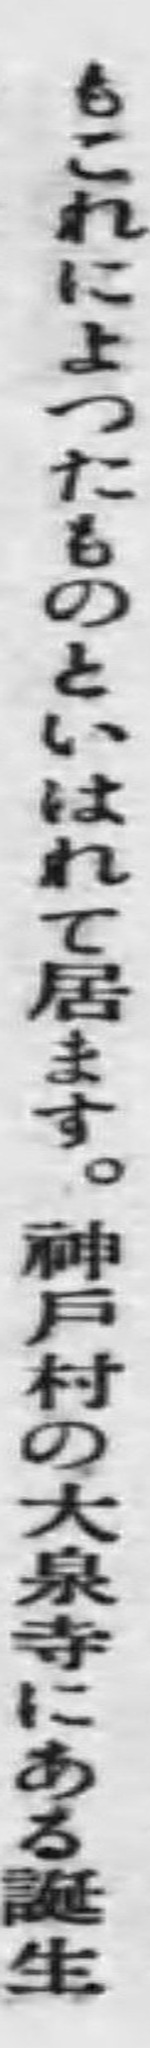もこれによつたものといはれて居ます。神戸村の大泉寺にある誕生
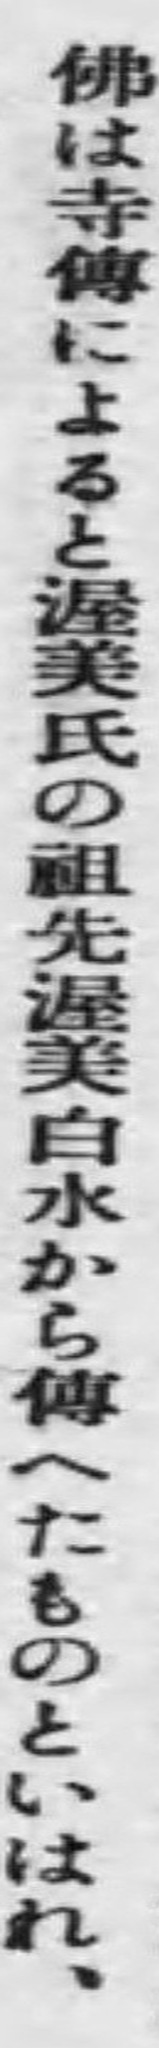仏は寺伝によると渥美氏の祖先渥美白水から伝へたものといはれ、
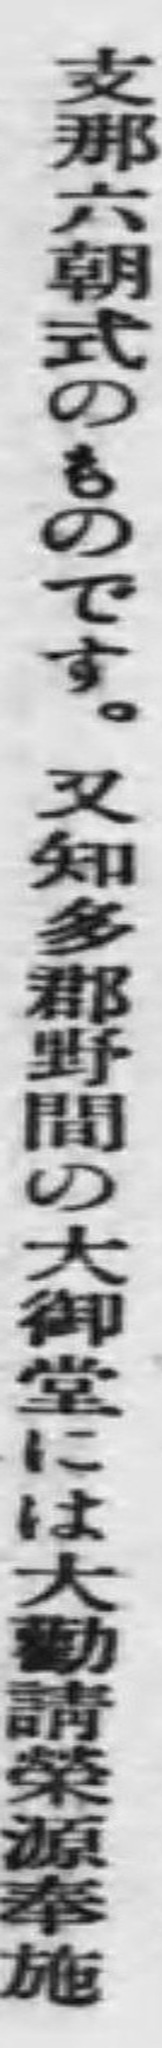支那六朝式のものです。又知多郡野間の大御堂には大勧請栄源奉施
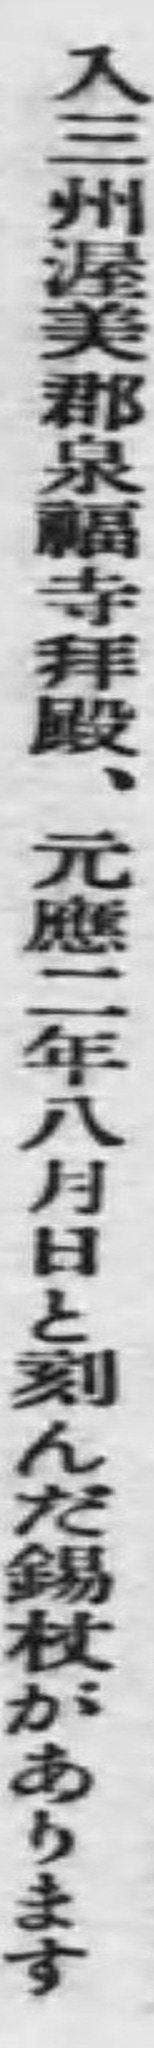入三州渥美郡泉福寺拝殿、元応二年八月日と刻んだ錫杖があります
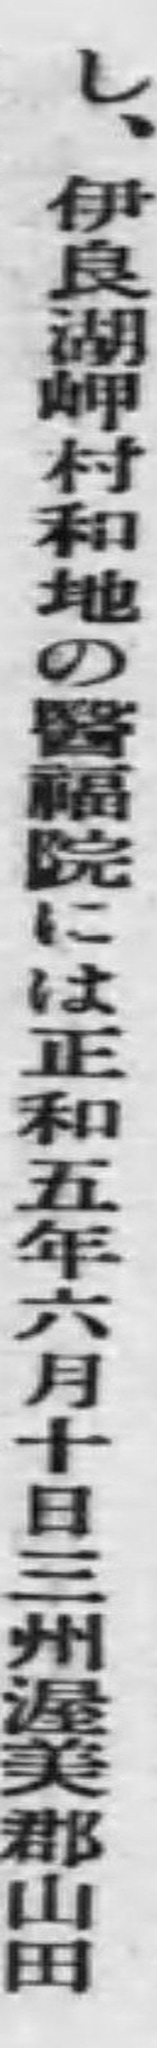し、伊良湖岬村和地の医福院には正和五年六月十日三州渥美郡山田
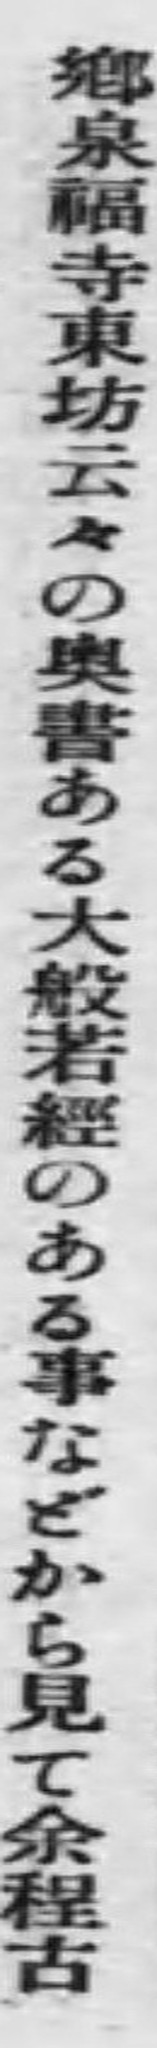郷泉福寺東坊云々の奥書ある大般若経のある事などから見て余程古
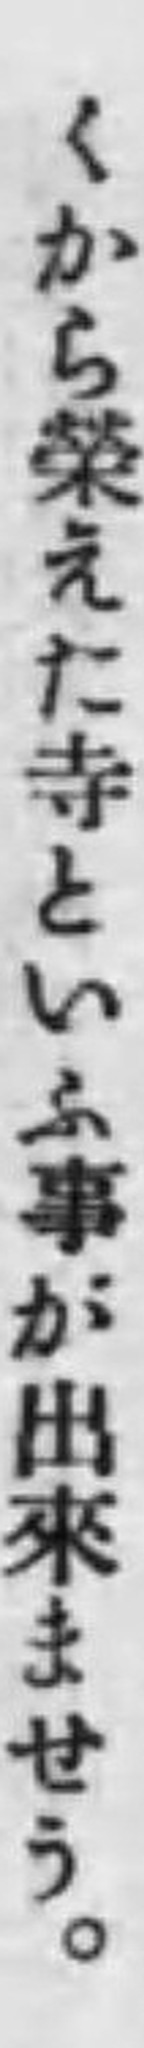くから栄えた寺といふ事が出来ませう。
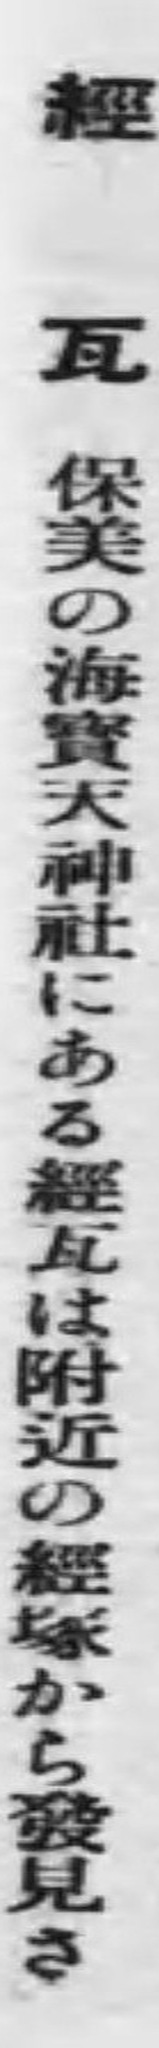経瓦保美の海宝天神社にある経瓦は附近の経塚から発見さ
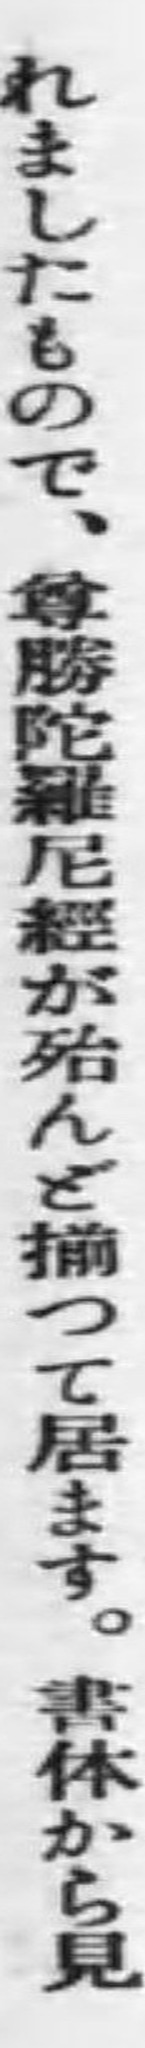れましたもので、尊勝陀羅尼経が殆んど揃つて居ます。書体から見
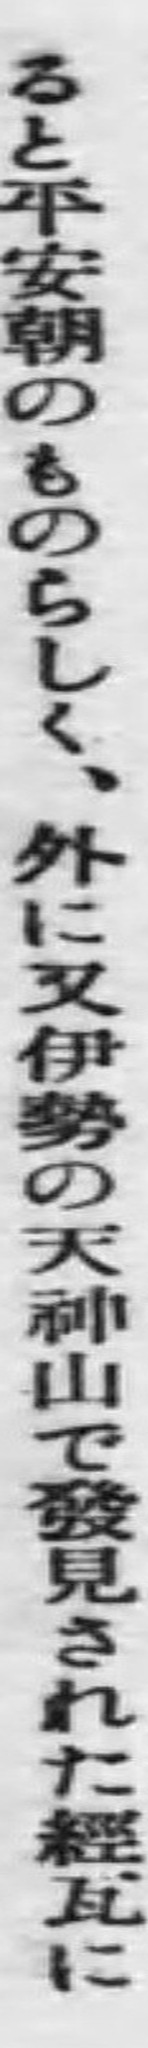ると平安朝のものらしく、外に又伊勢の天神山で発見された経瓦に
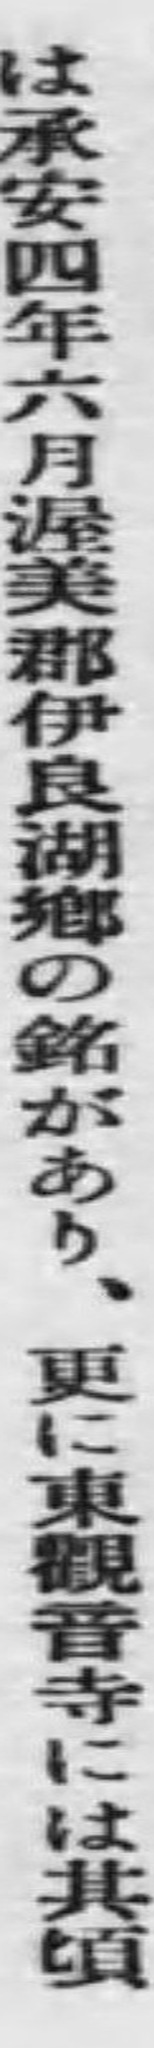は承安四年六月渥美郡伊良湖郷の銘があり、更に東観音寺には其頃
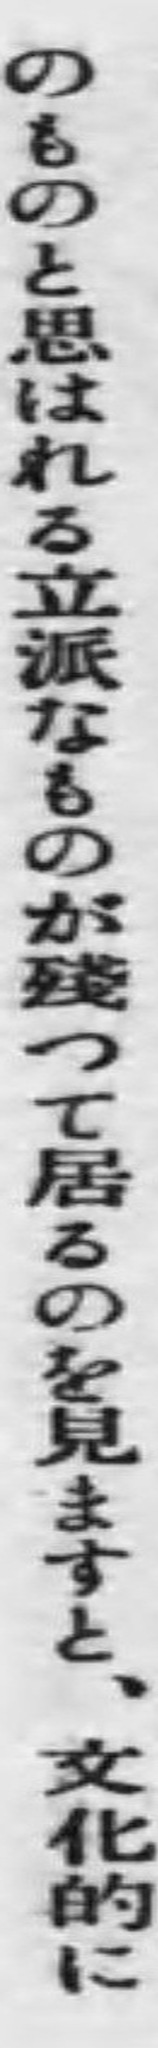のものと思はれる立派なものが残つて居るのを見ますと、文化的に
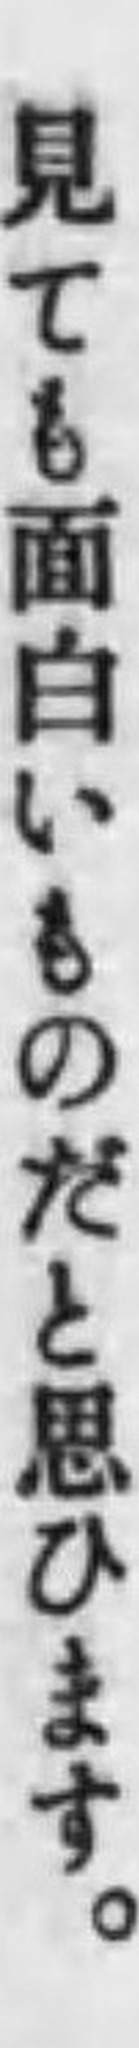見ても面白いものだと思ひます。
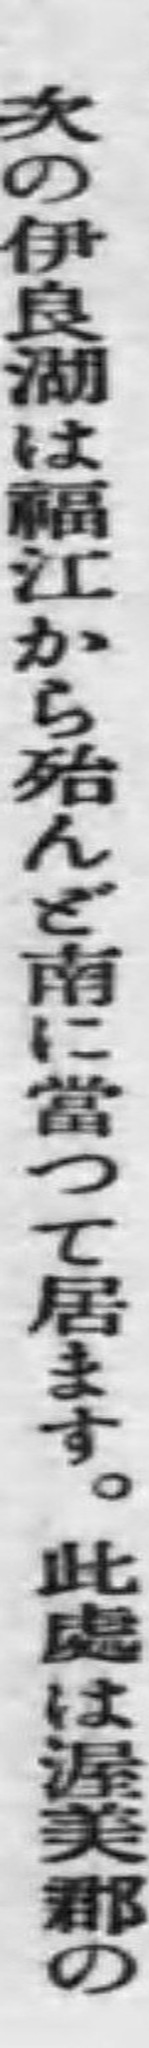次の伊良湖は福江から殆んど南に当つて居ます。此処は渥美郡の
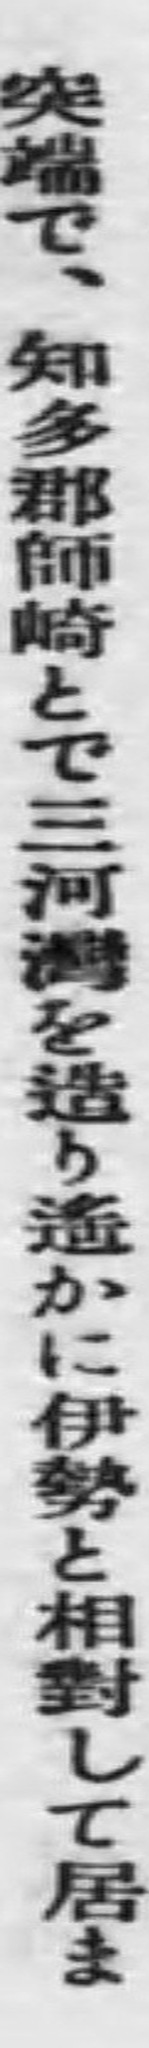突端で、知多郡師崎とで三河湾を造り遥かに伊勢と相対して居ま
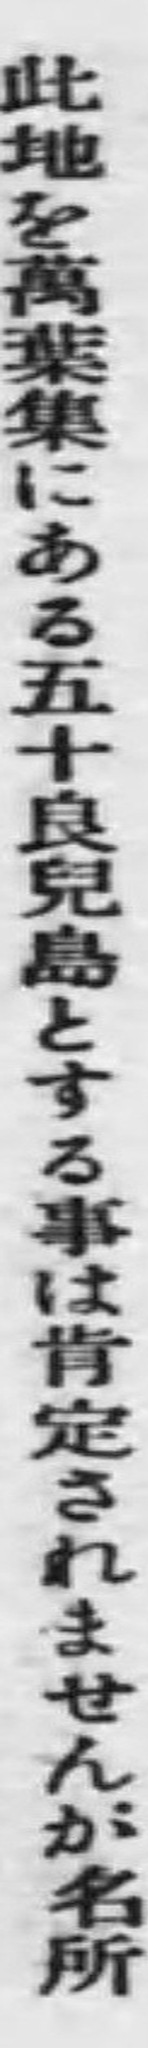此地を万葉集にある五十良児島とする事は肯定されませんが名所
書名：東三河道中記 : 豊橋市及其附近案内
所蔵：国立国会図書館 National Diet Library, JAPAN
